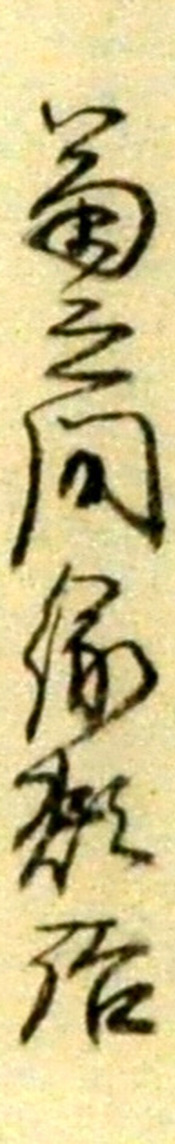菊之間縁頬詰
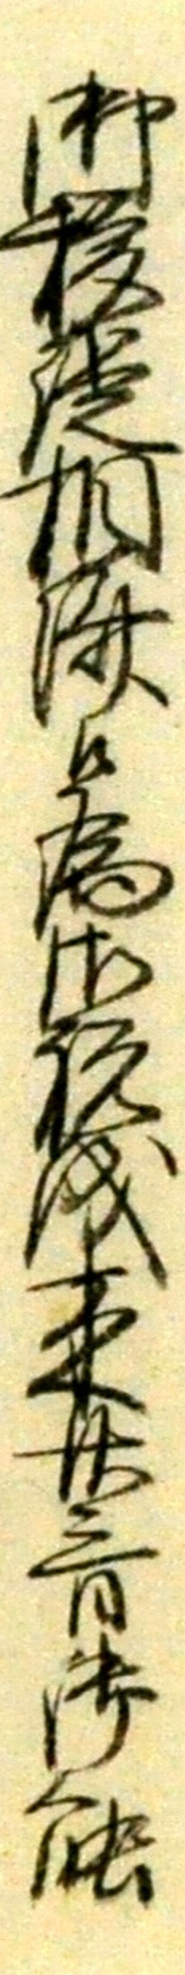御移徙相済候為御祝儀来廿三日御能
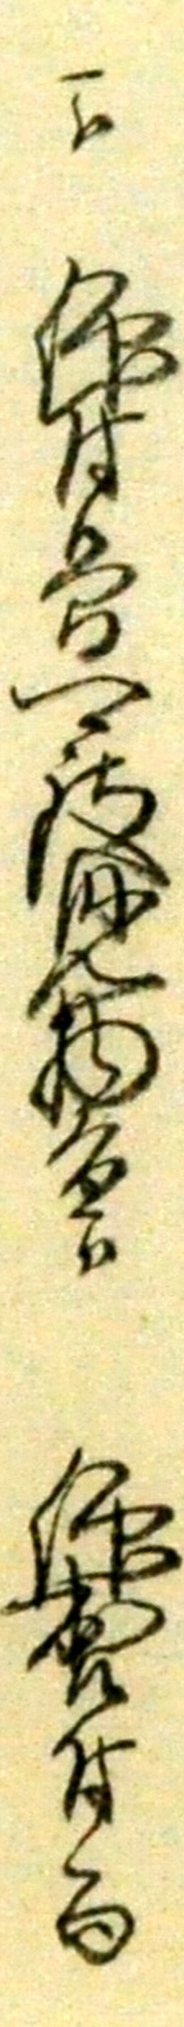被仰付候間可致見物旨被仰出候付而
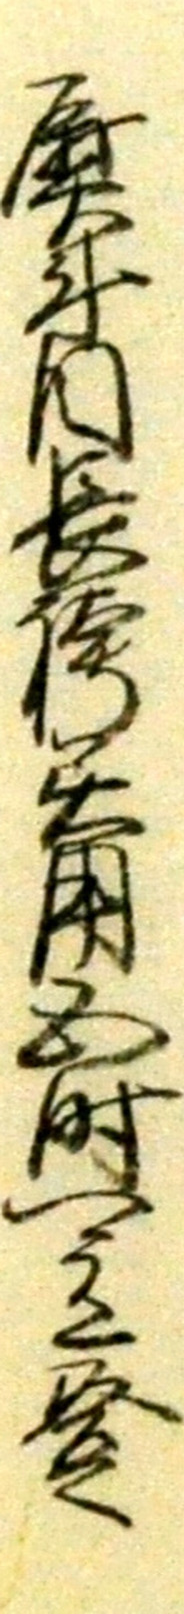熨斗目長袴着用五時可有登

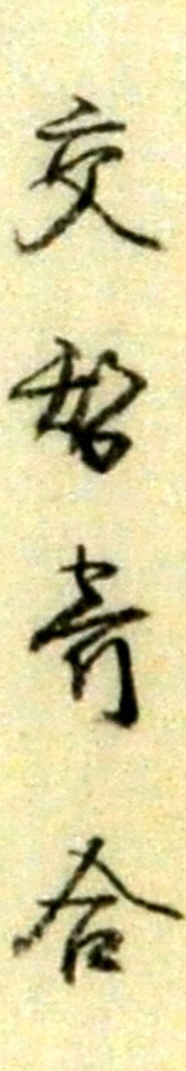交替寄合
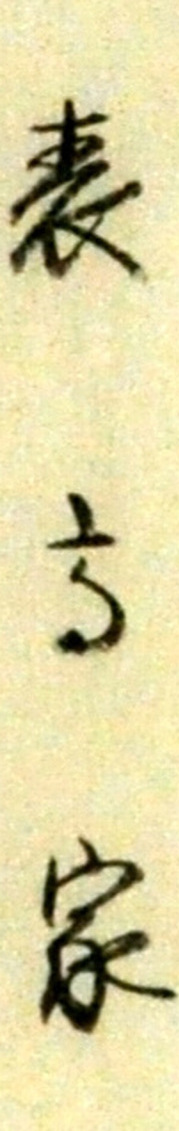表高家
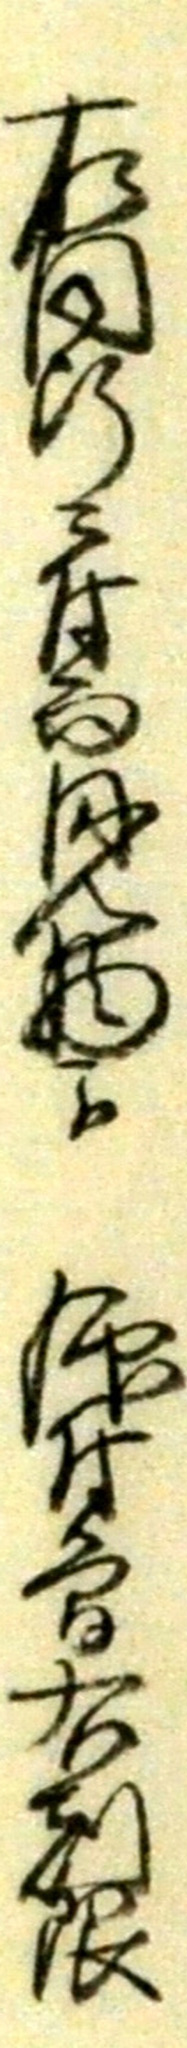右同断ニ付而見物被仰付候間右刻限
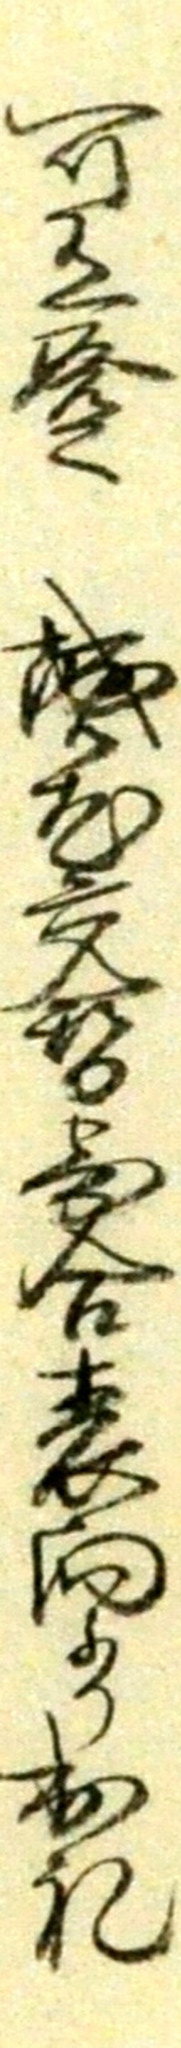可有登城候尤交替寄合表向より出礼
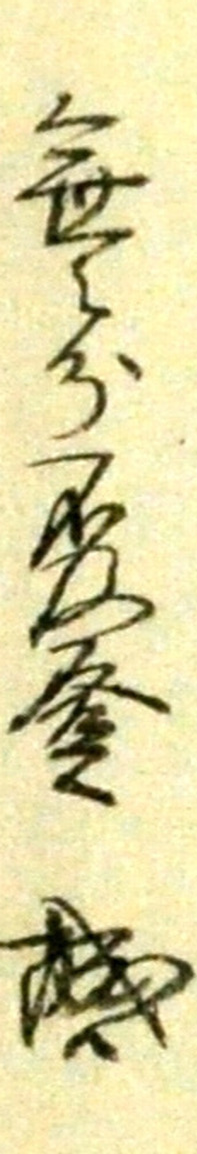無之分不及登城候
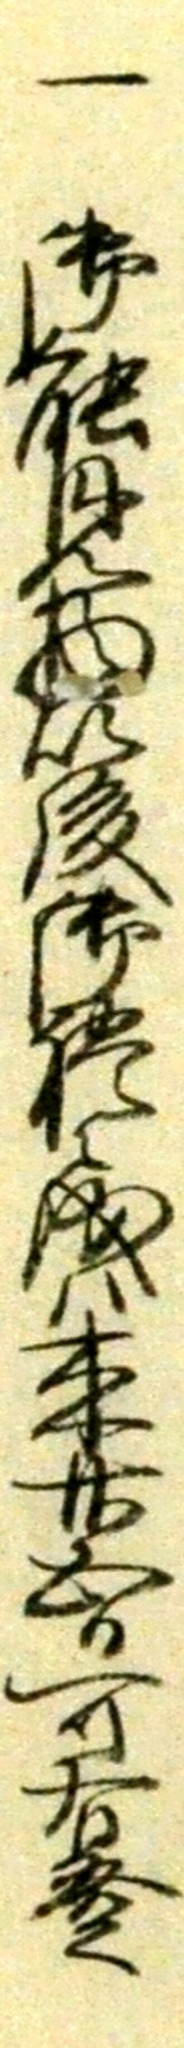一御能見物以後御礼之儀ハ来廿五日可有登
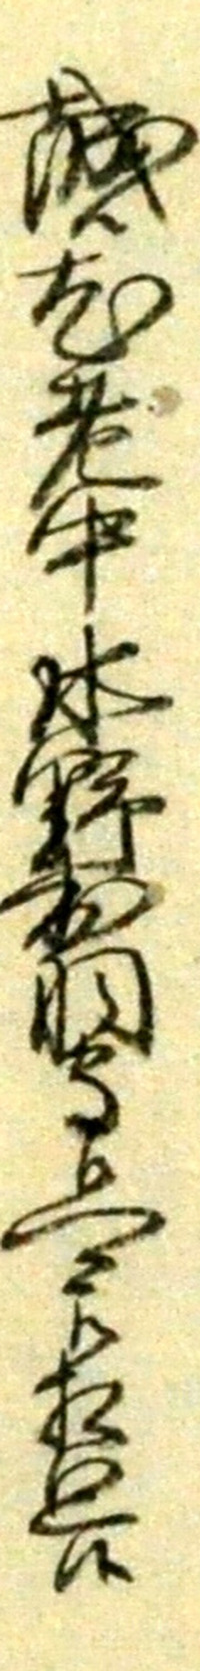城候尤老中水野出羽守え可被相廻候
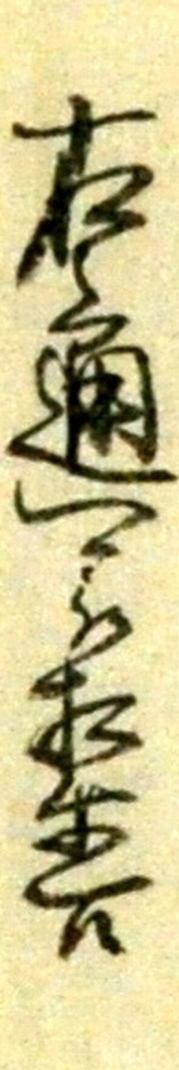右之通可被相達候
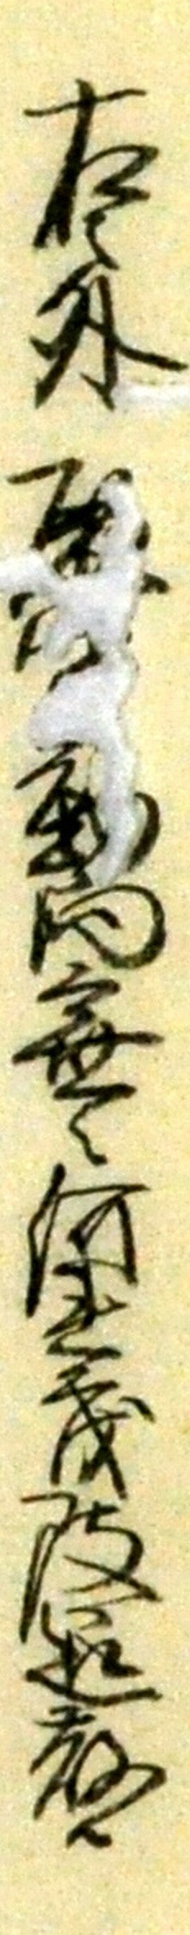右之外罷勤向無之何れも致退散候
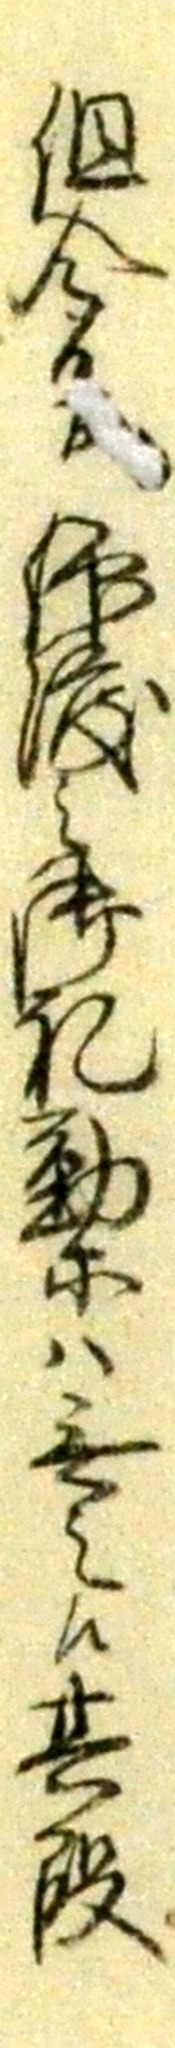但今日被仰渡之御礼勤等ハ無之候其段
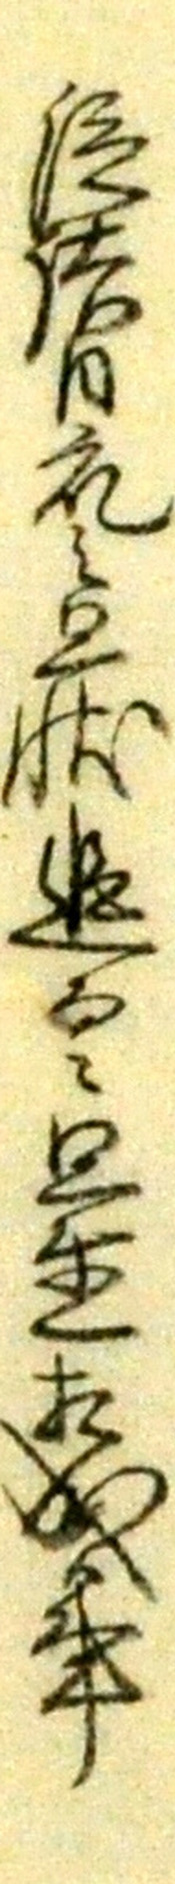従詰日衆之廻状追而ニ廻達相成候事
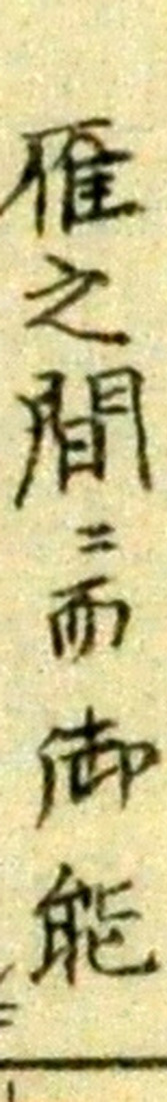雁之間ニ而御能
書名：御移徒相済御祝儀御能ノ節ノ留外
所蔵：伊那市立高遠町図書館・合同会社AMANE
